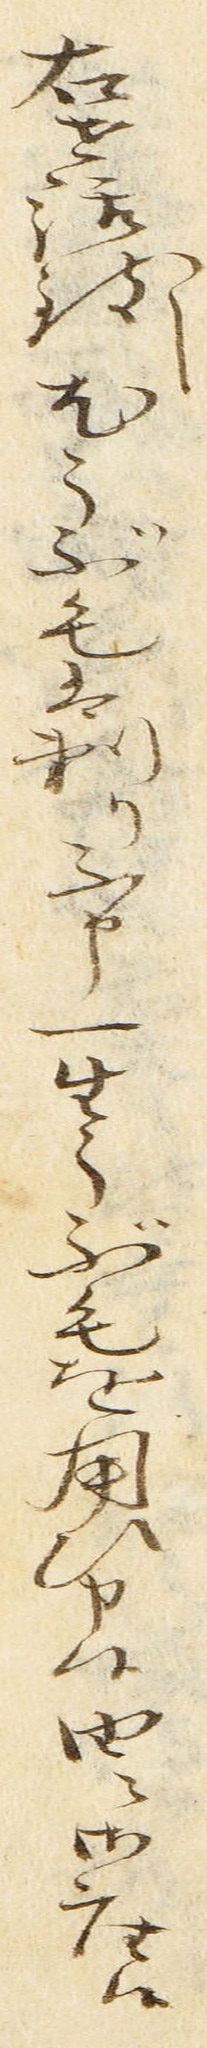右せ話致し尤うぶ毛は剃り不申一生うぶ毛を用ひ申候由に御座候
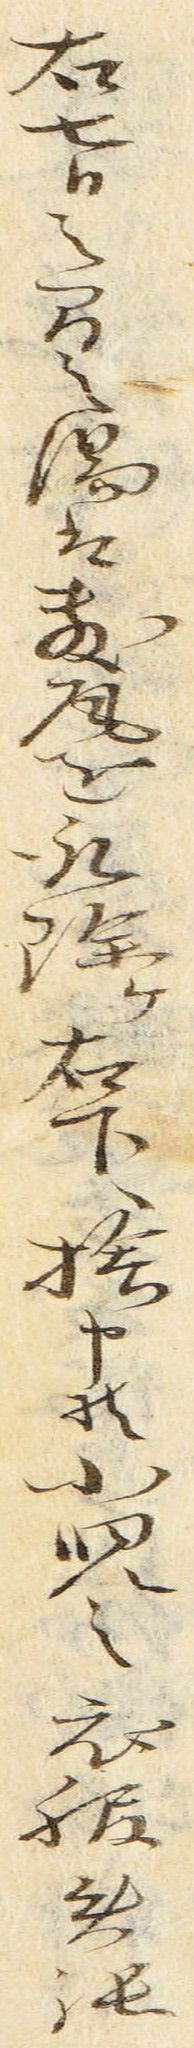右七日之間之湯は敷瓦を取除ケ右下へ捨申候小児之衣服失張
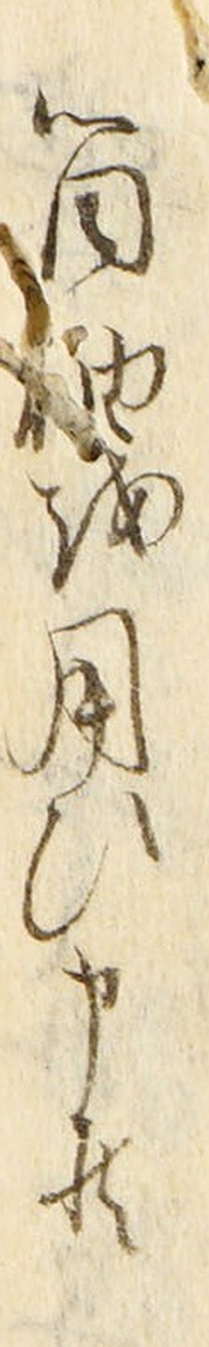筒袖を用ひ申候
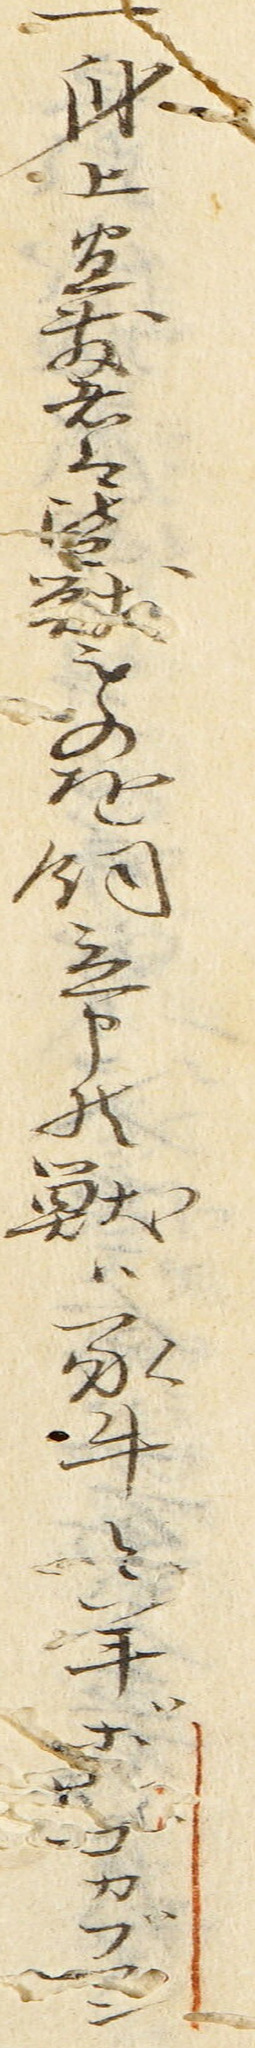一身上宜敷者は皆獣ものを飼立申候獣は豕牛とい？ボロコカブマン

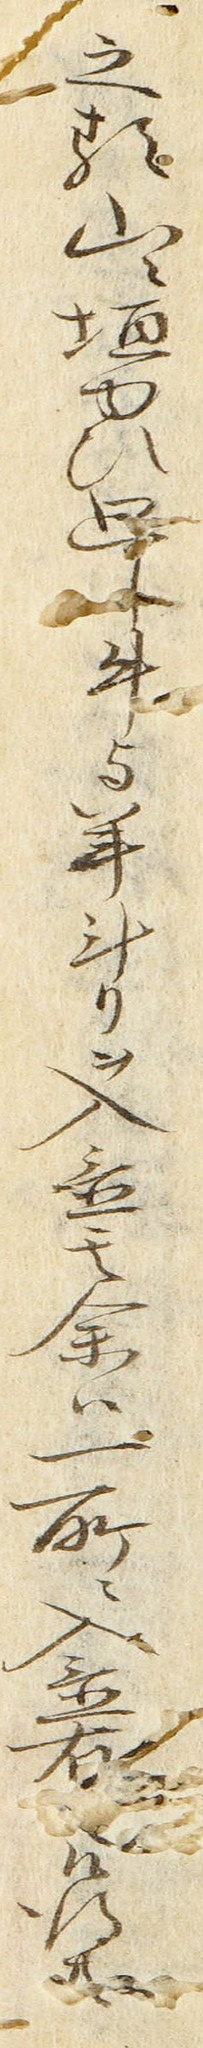之類山緬に垣ゆひ廻し牛と羊斗りヲ入置其余は一所に入置有之候得共
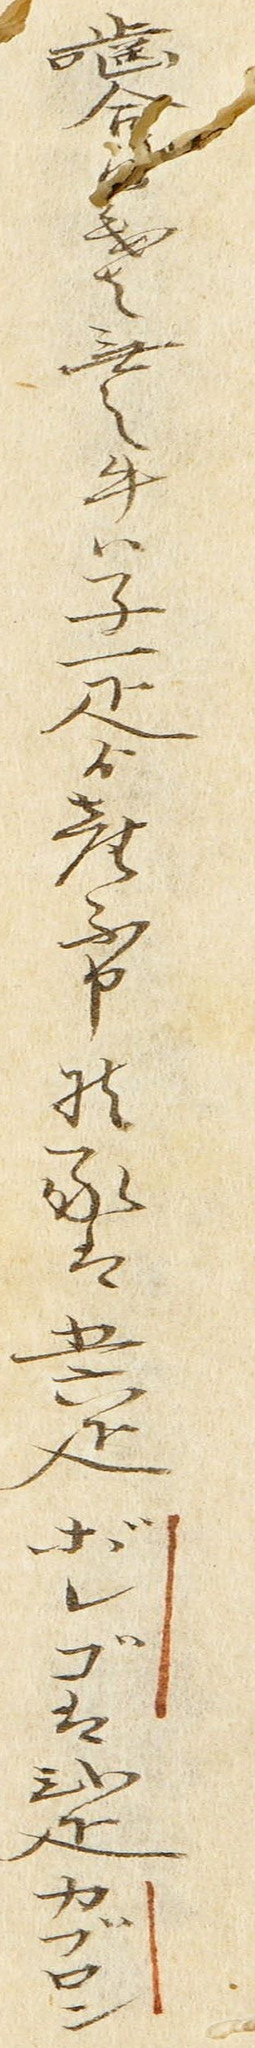噛合候義は無之牛は子一疋ゟ産不申候豕は五六疋ボレゴは弐疋カブロン
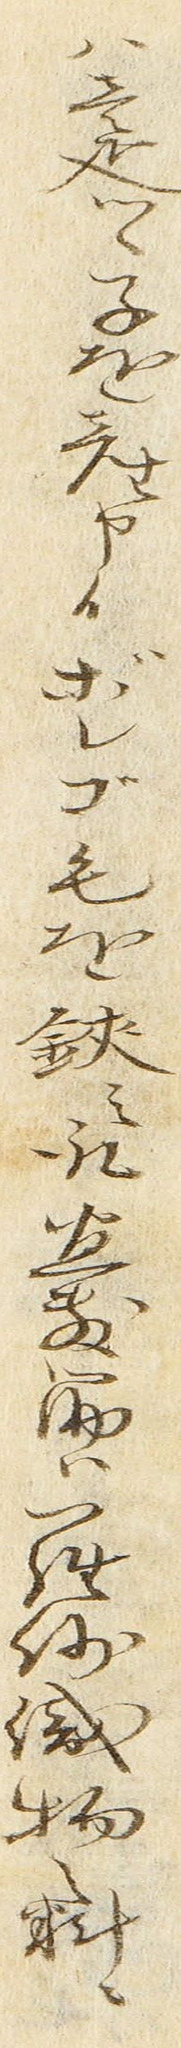は壱疋ツツ子を産申候ボレゴ毛を鋏み取宜敷筋は羅紗織物之料と
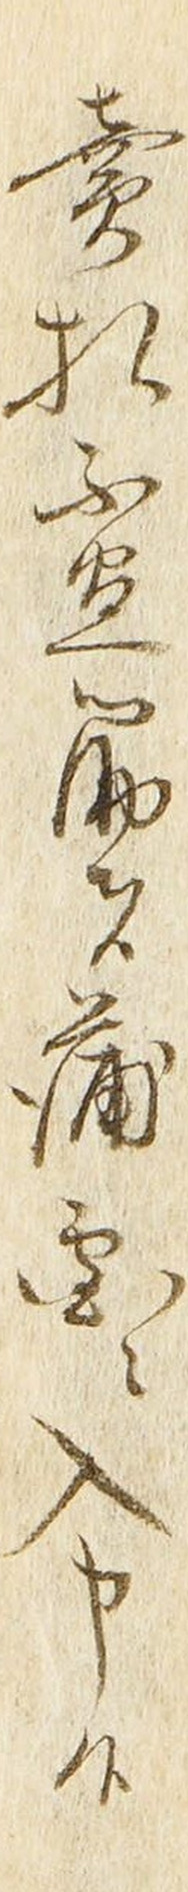売払不宜筋は布団に入申候
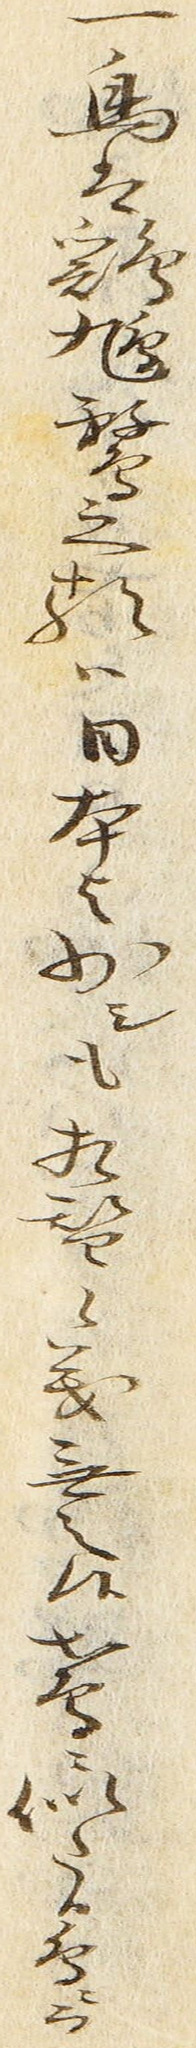一鳥は鶏鳩鶩之類は日本と少しも相替之義無之候？に似たる鳥に而
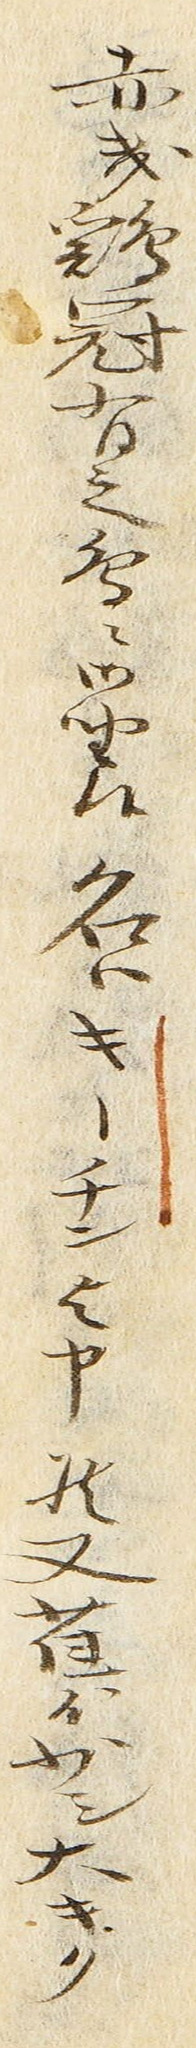赤義鶏冠有之鳥に御座候名はキーチンと申候又雀ゟ少し大きく
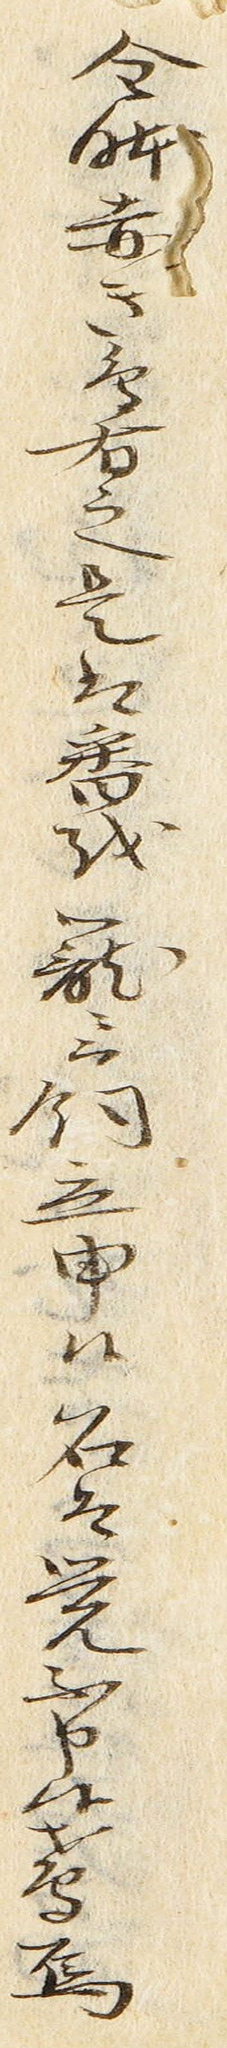全躰赤き鳥有之是は番物を籠輪に而飼立申候名は覚不申候？？
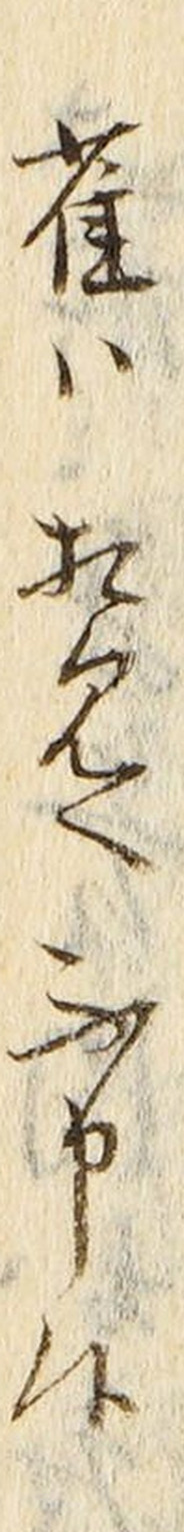雀は相見へ不申候
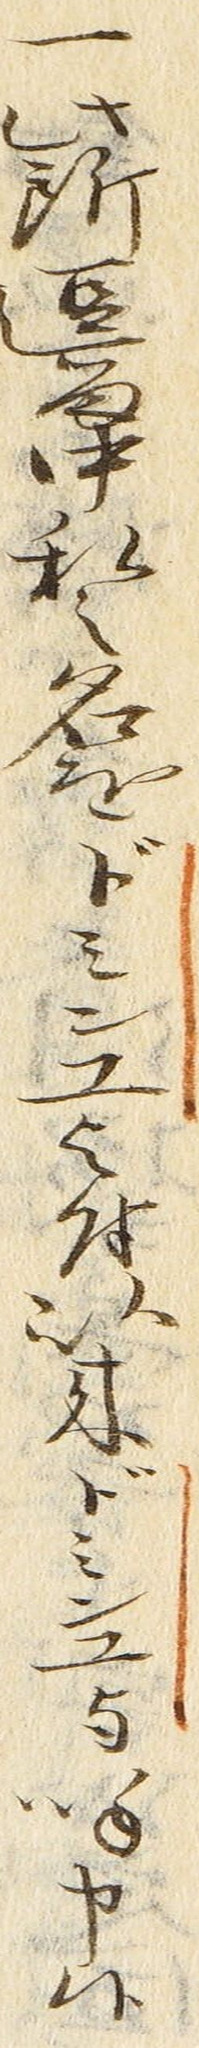一此所逗留中私之名をドミンユと付以来ドミンユと呼申候
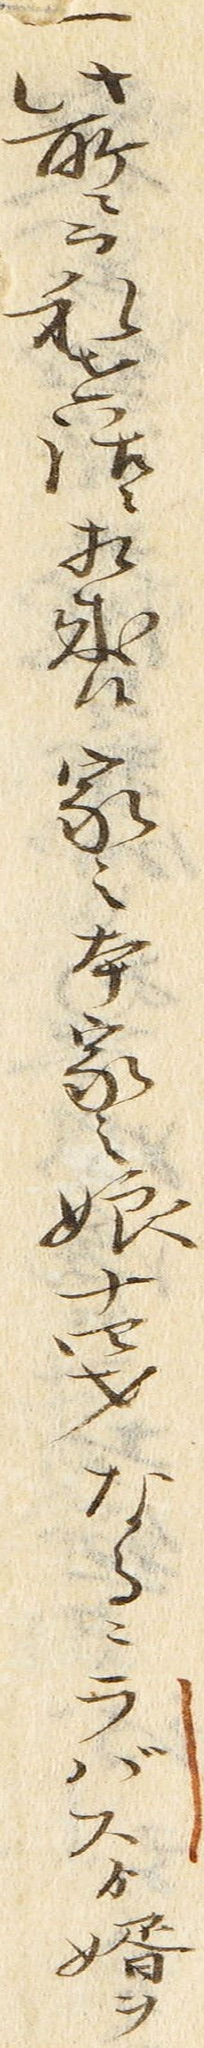一此所に而私をいつに相来候家の本家之娘十四才なるこラバスゟ婿ヲ
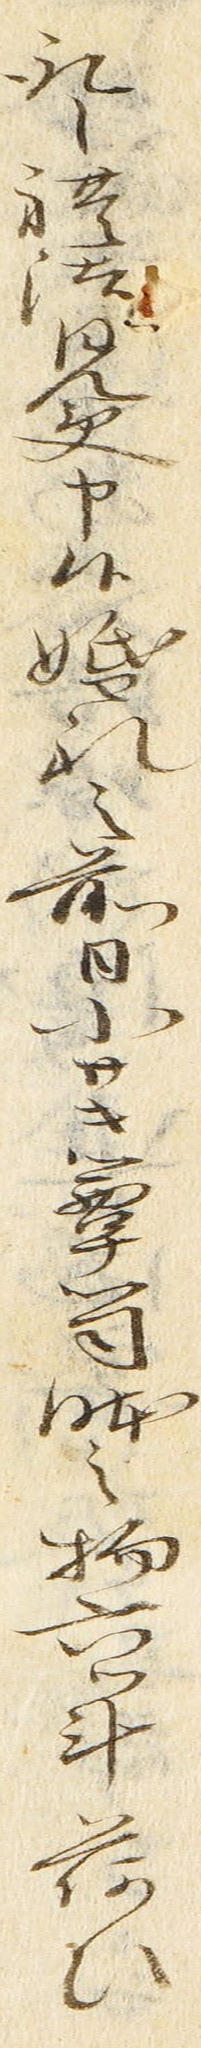取致し礼法見受申候婚礼之前日小さき箪笥躰之物六ツ斗荷ひ
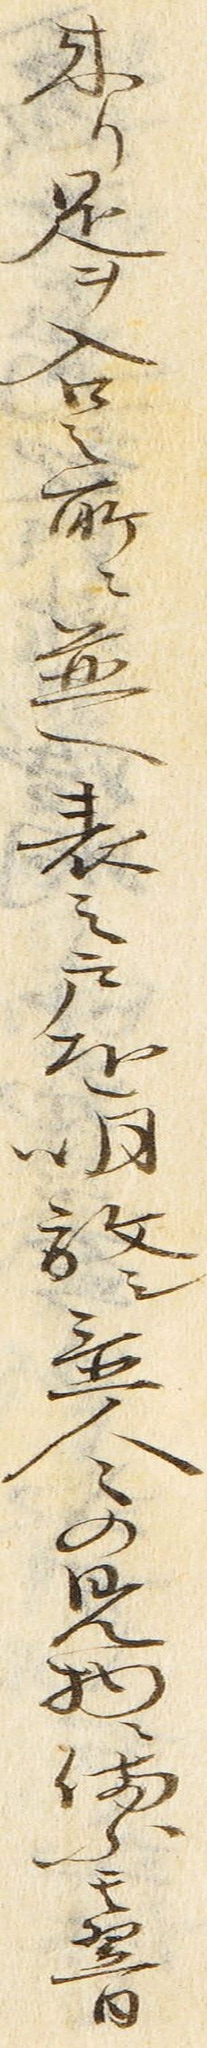来り是を入口之所に並へ表之戸を明放シ置人々の見物に備ふ其翌日
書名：漂流人弥市之記
